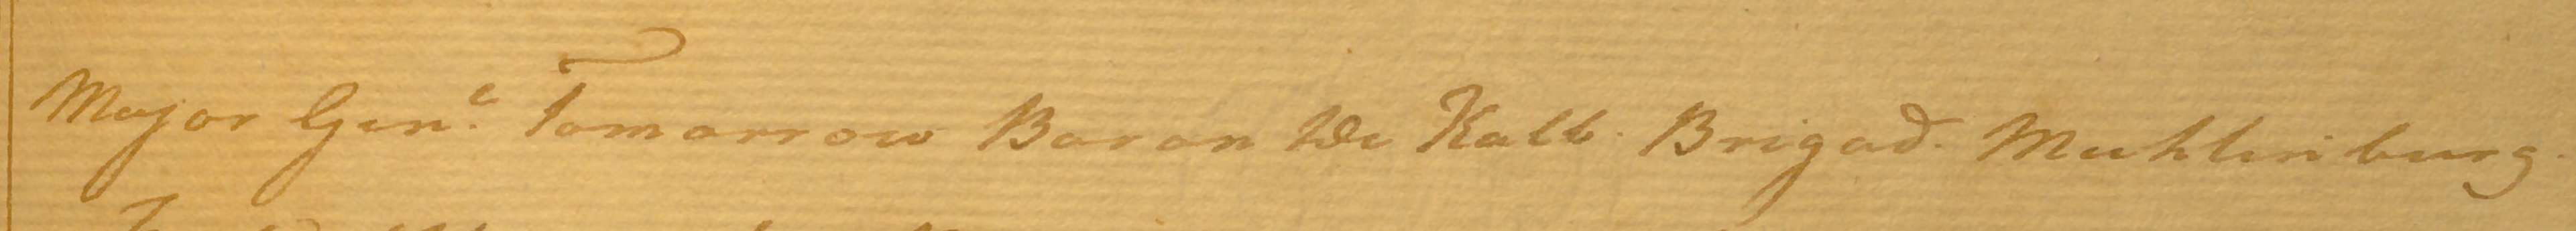Major Gen^l. Tomorrow Baron De Kalb Brigad. Muhlinburg
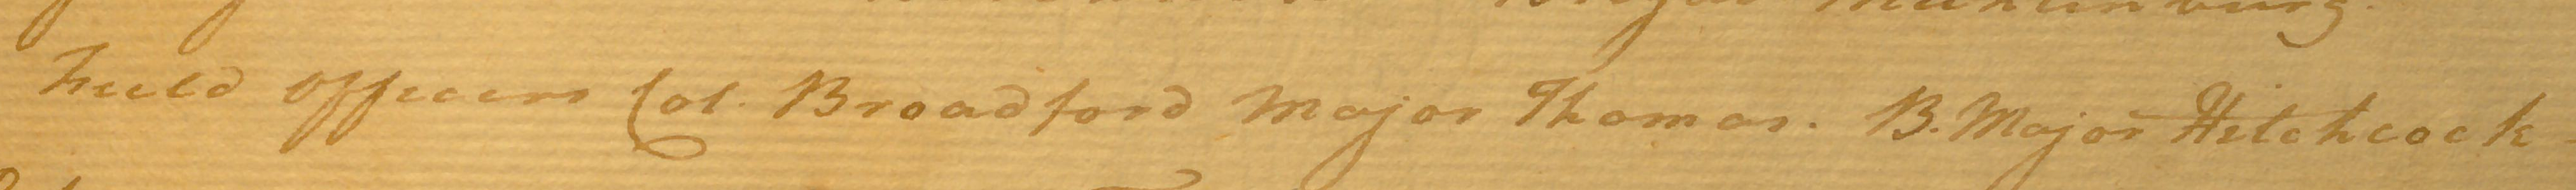Field Officers Col Broadford Major Thomas. B. Major Hitchcock
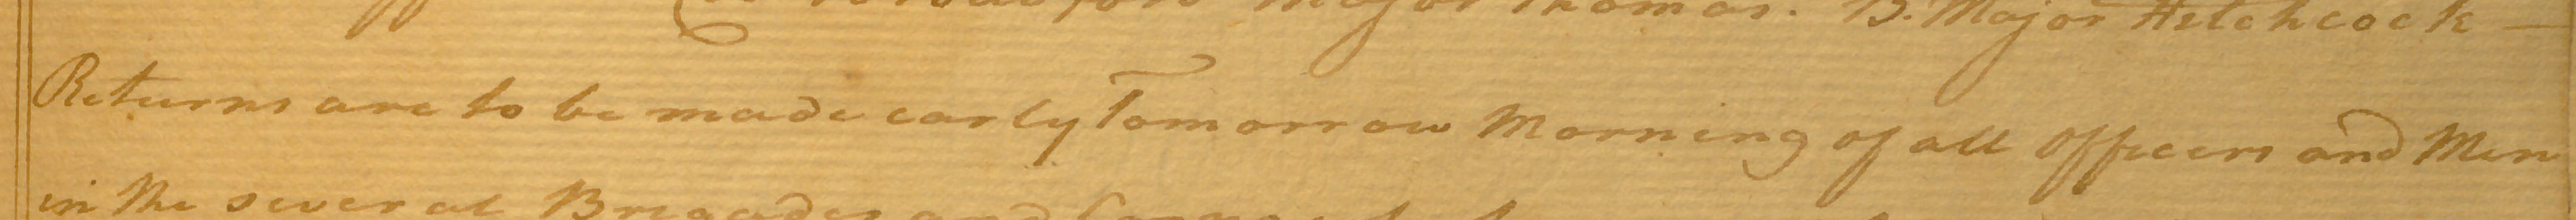Returns are to be made early Tomorrow morning of all officers and Men
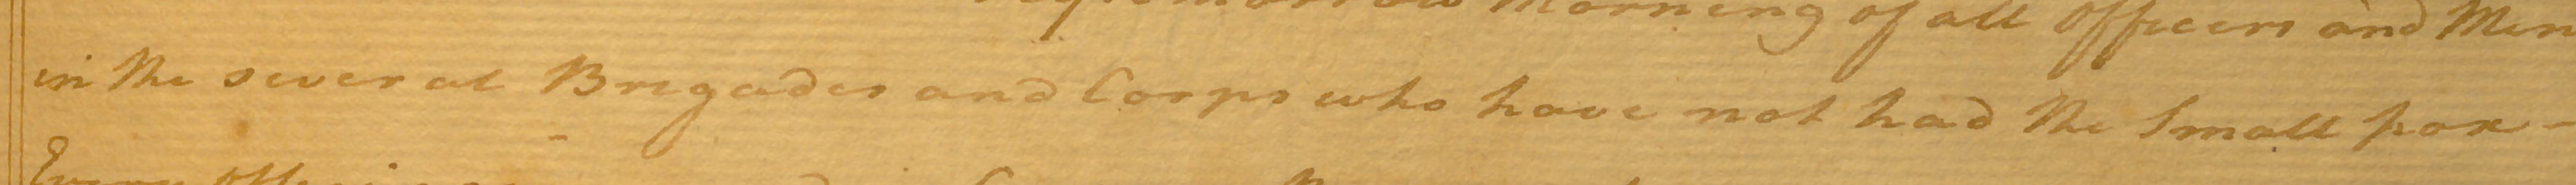in the several Brigades and Corps who have not had the small pox-
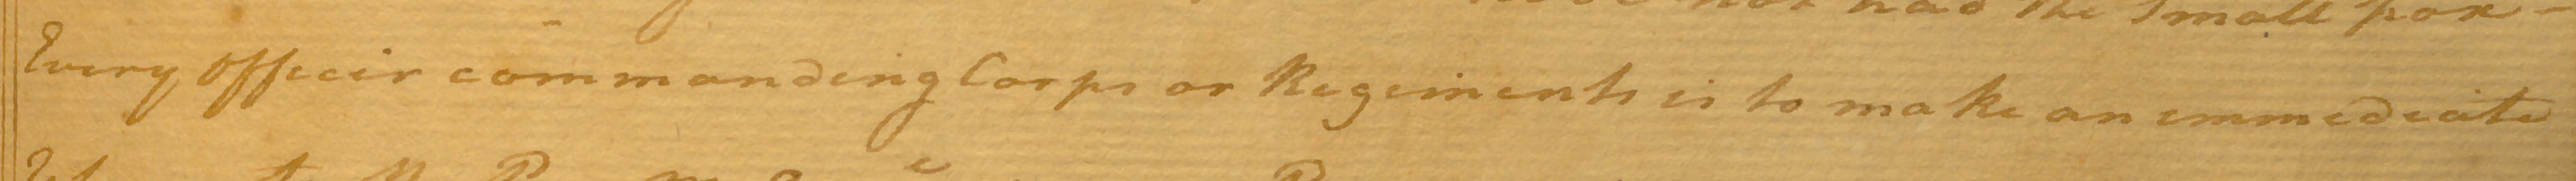Every officer commanding Corps or Regiments is to make an immediate
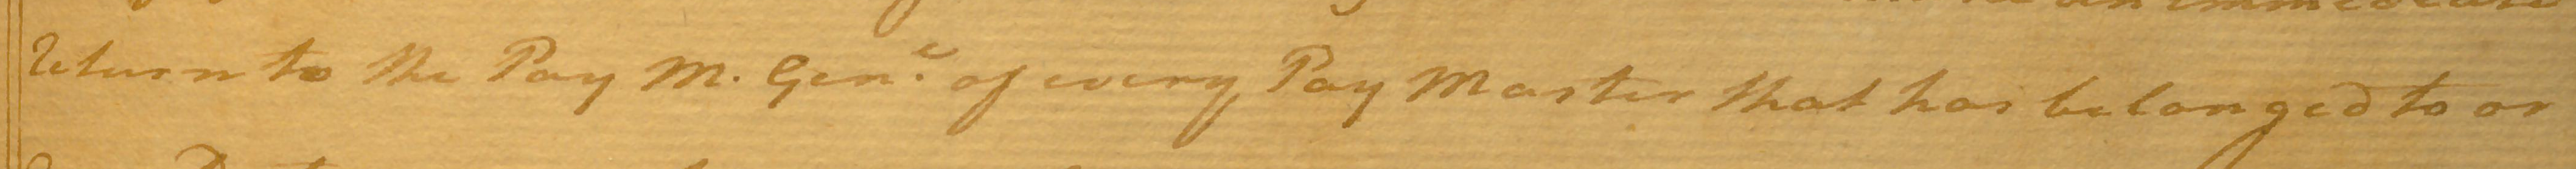return to the Pay M. Gen^l. of every Pay Master that has belonged to or
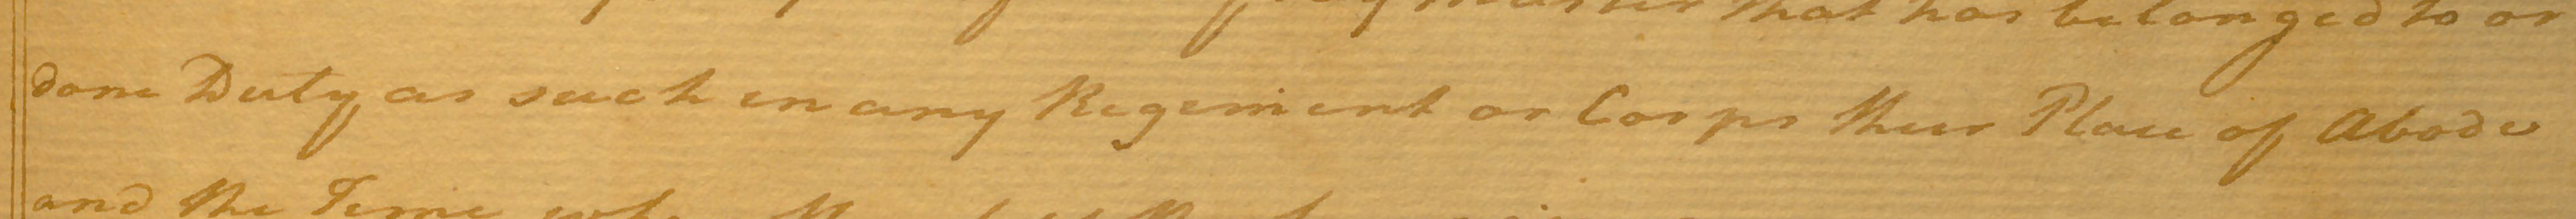done Duty as such in any Regiment or Corps their Place of Abode
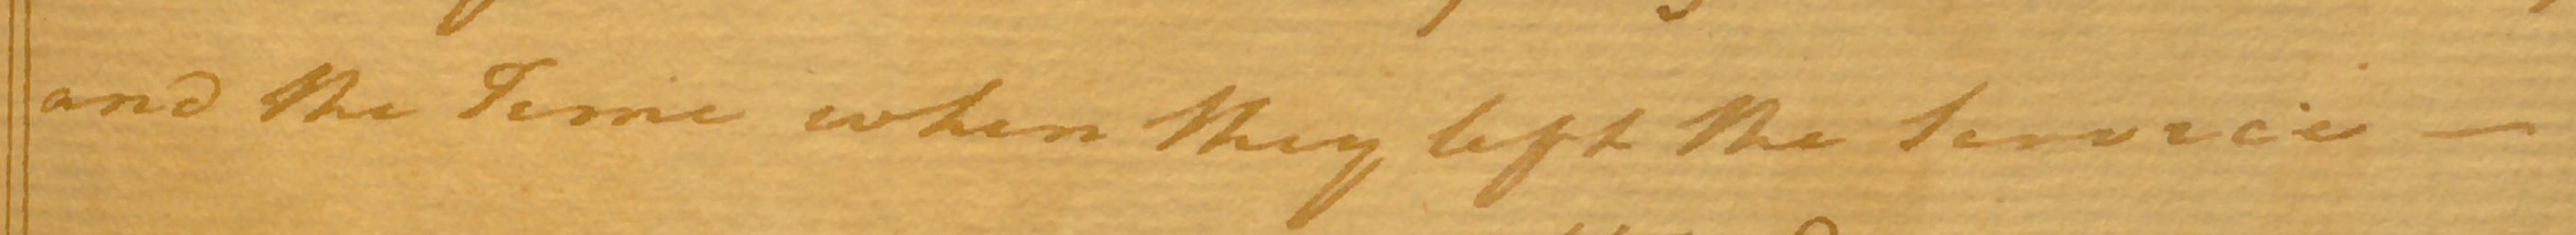and the Time when they left the service-
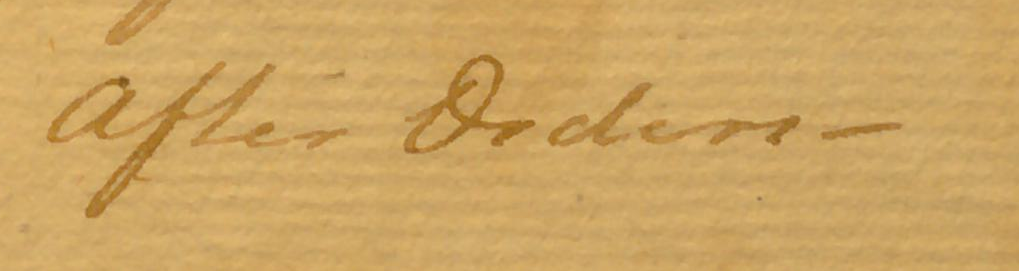After Orders-
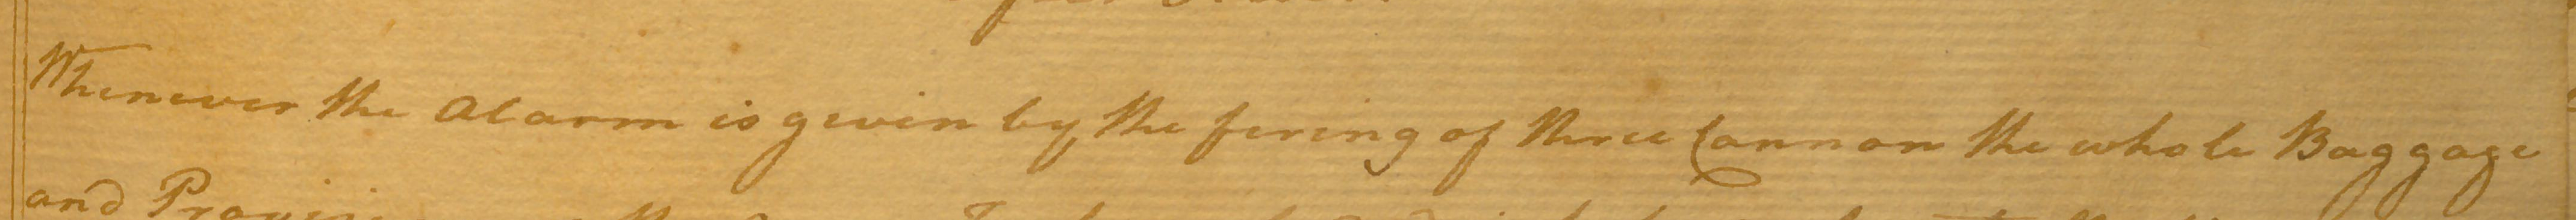Whenever the alarm is given by the firing of three Cannon the whole Baggage
